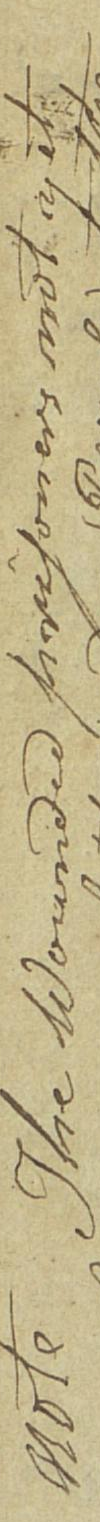Note The Wounded prisoners not yet
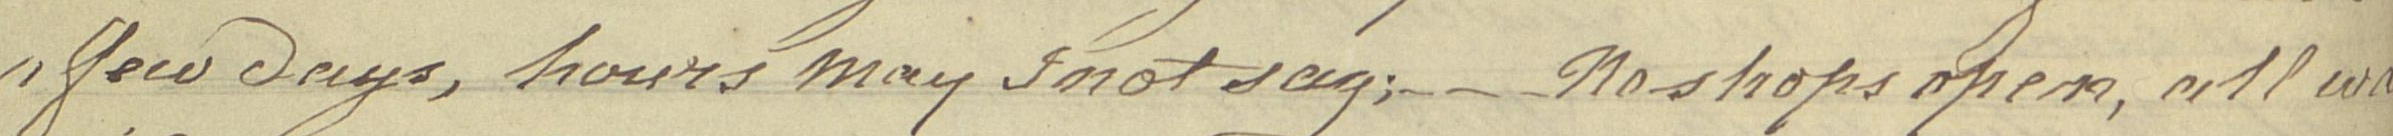a few days, hours may I not say; No shops open, all wa-
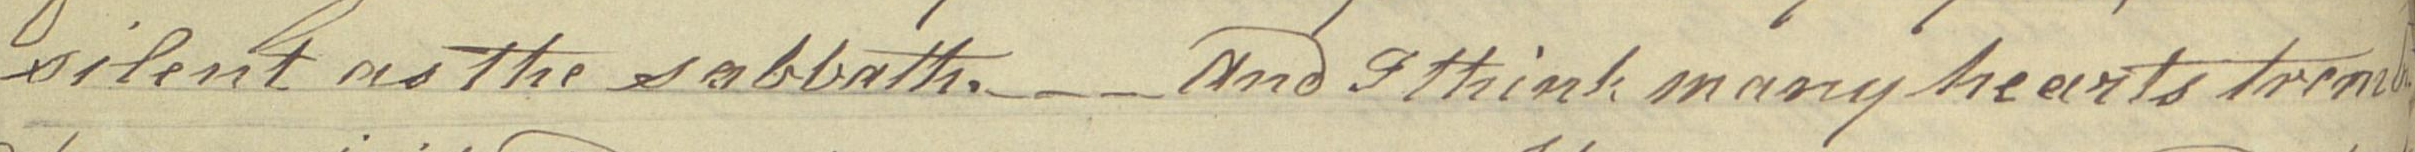silent as the sabbath. And I think many hearts tremb-
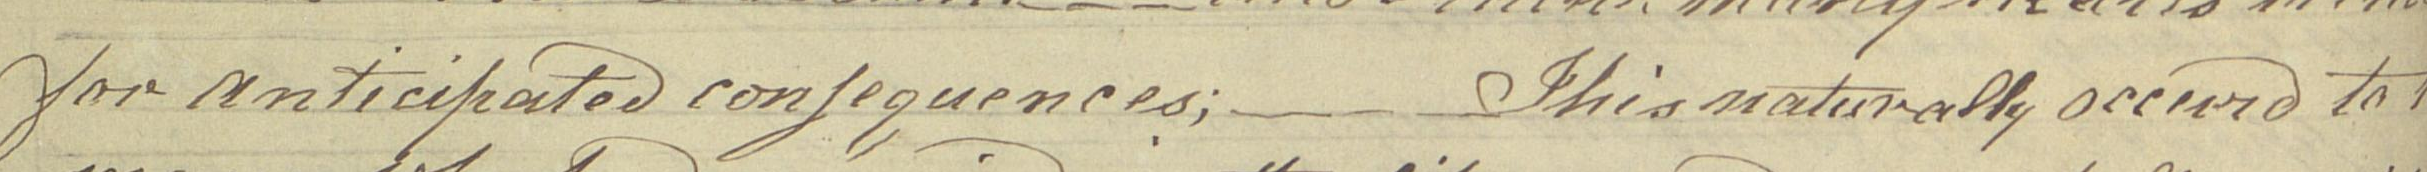for anticipated consequences; This naturally occurd to b-
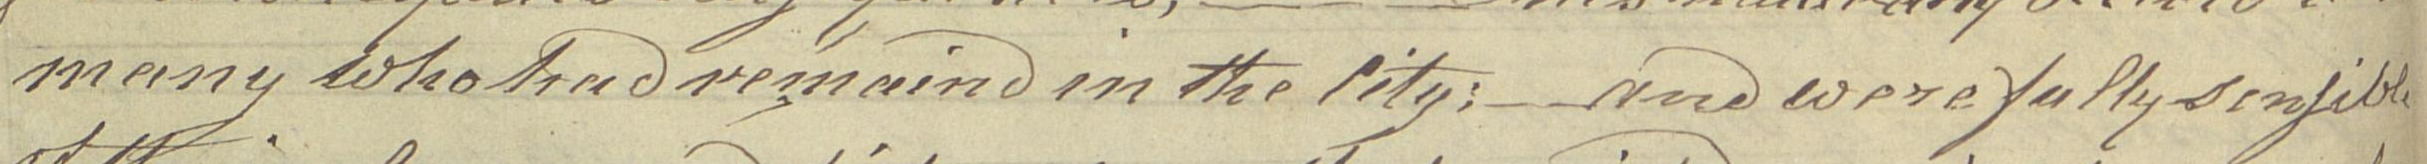many who had remaind in the City; and were fully sensible
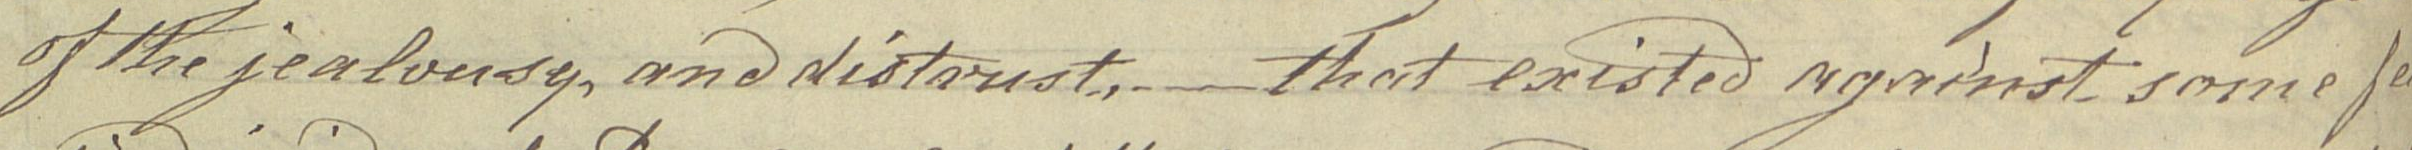of the jealousy, and distrust. that existed against some few
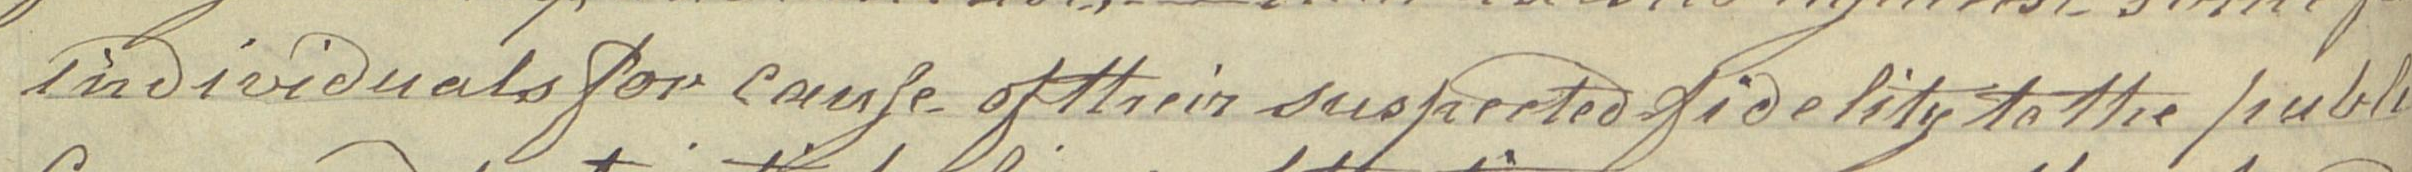individuals for cause of their suspected fidelity to the public
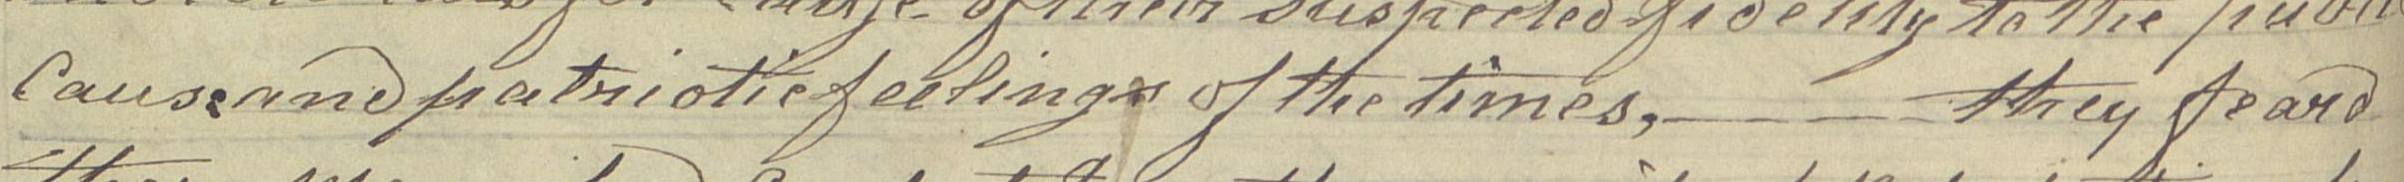Cause and patriotic feelings of the times, they feard
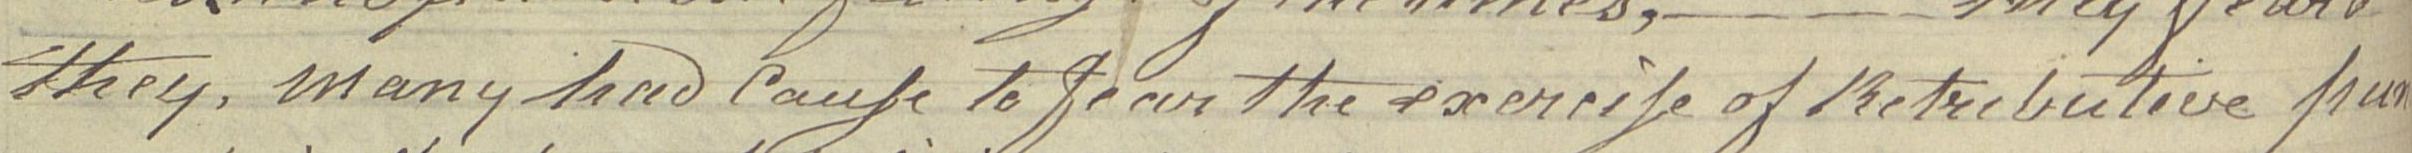They, Many had Cause to fear the exercise of Retributive pur-
